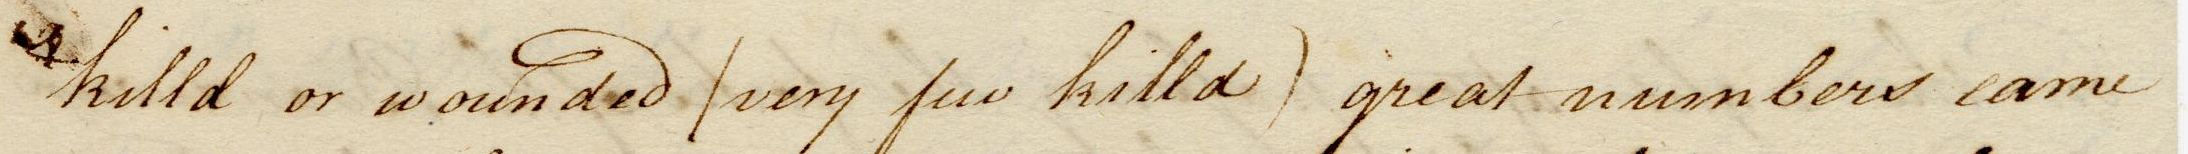killd or wounded (very few killd) great numbers came
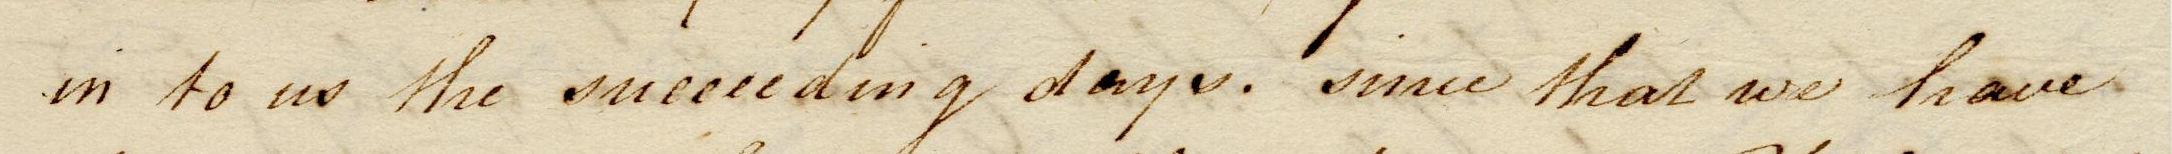in to us the succeeding days. since that we have
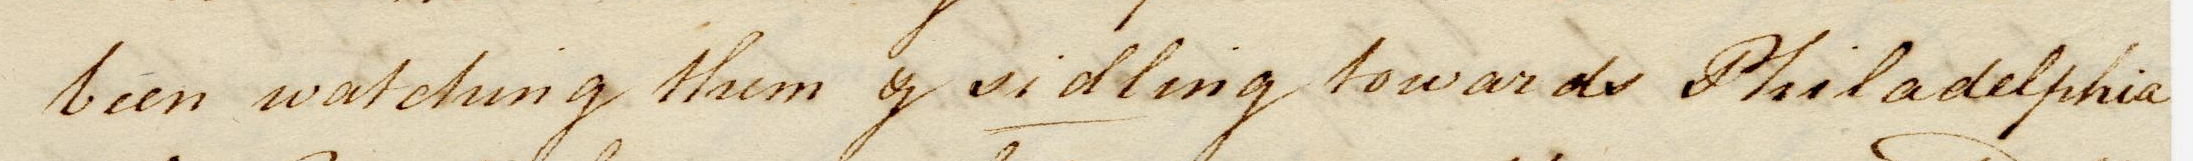been watching them & sidling towards Philadelphia
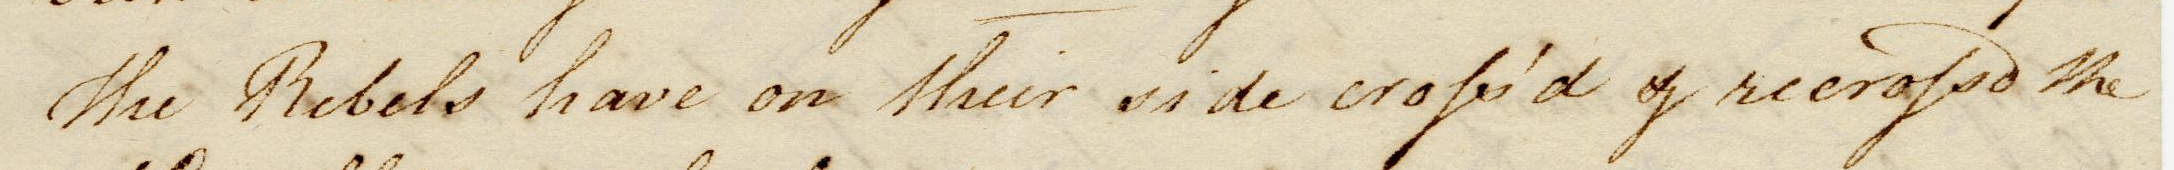the Rebels have on their side cross'd & recrossd the
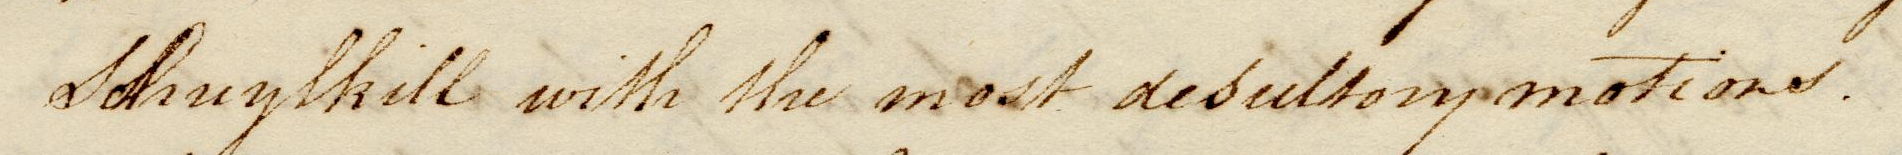Schuylkill with the most desultory motions.
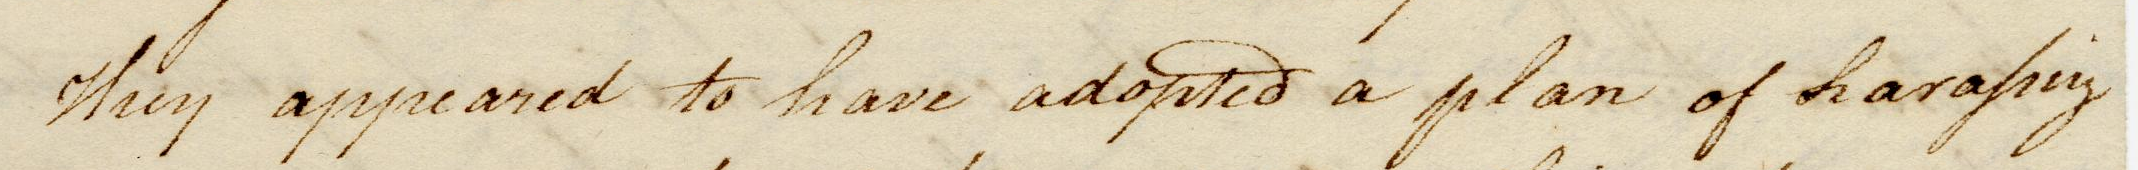They appeared to have adopted a plan of harassing
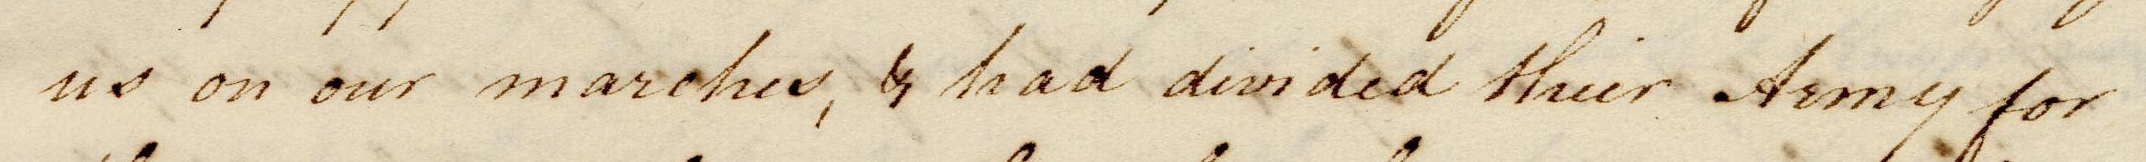us on our marches, & had divided their Army for
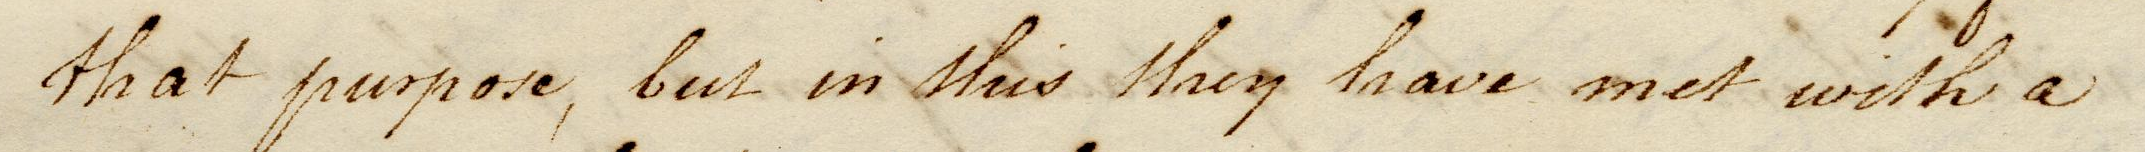that purpose, but in this they have met with a
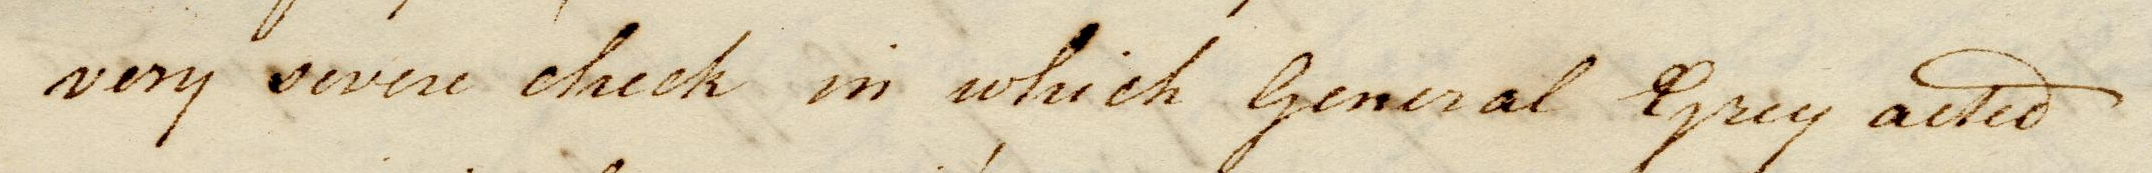very severe check in which General Grey acted
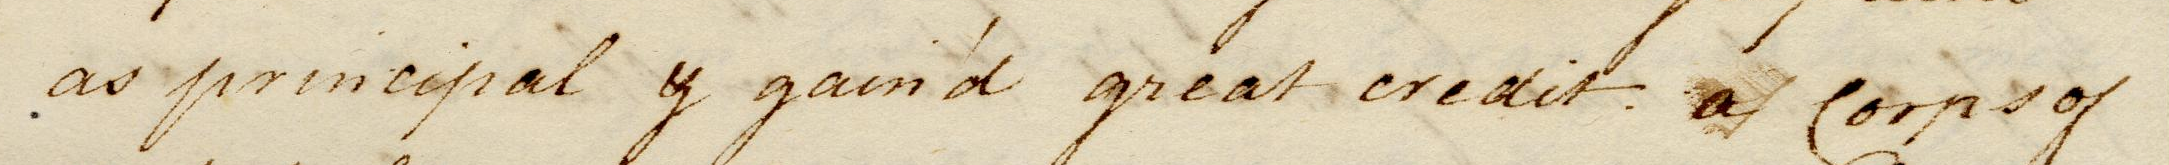as principal & gain'd great credit. a Corps of
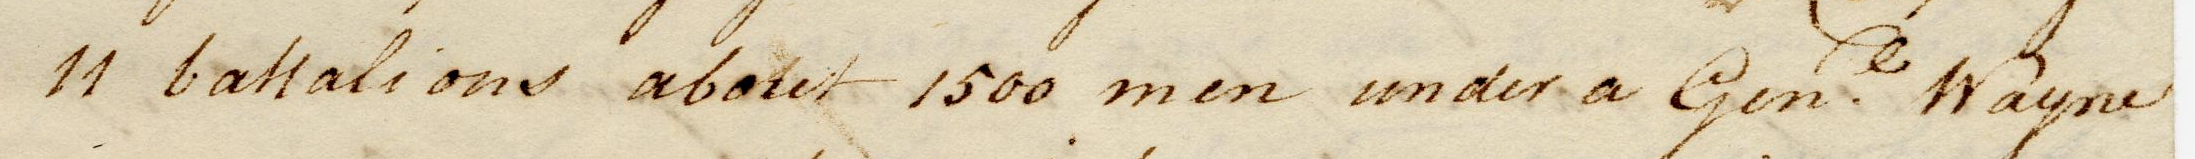11 battalions about 1500 men under a Gen^l. Wayne
